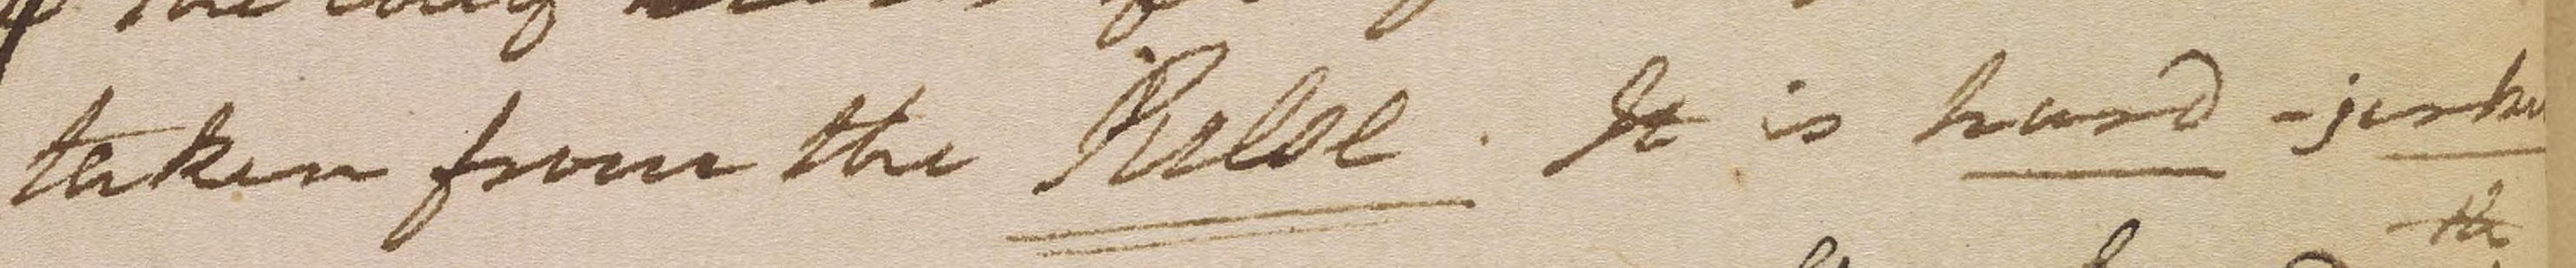taken from the Pulse. It is hard jerk
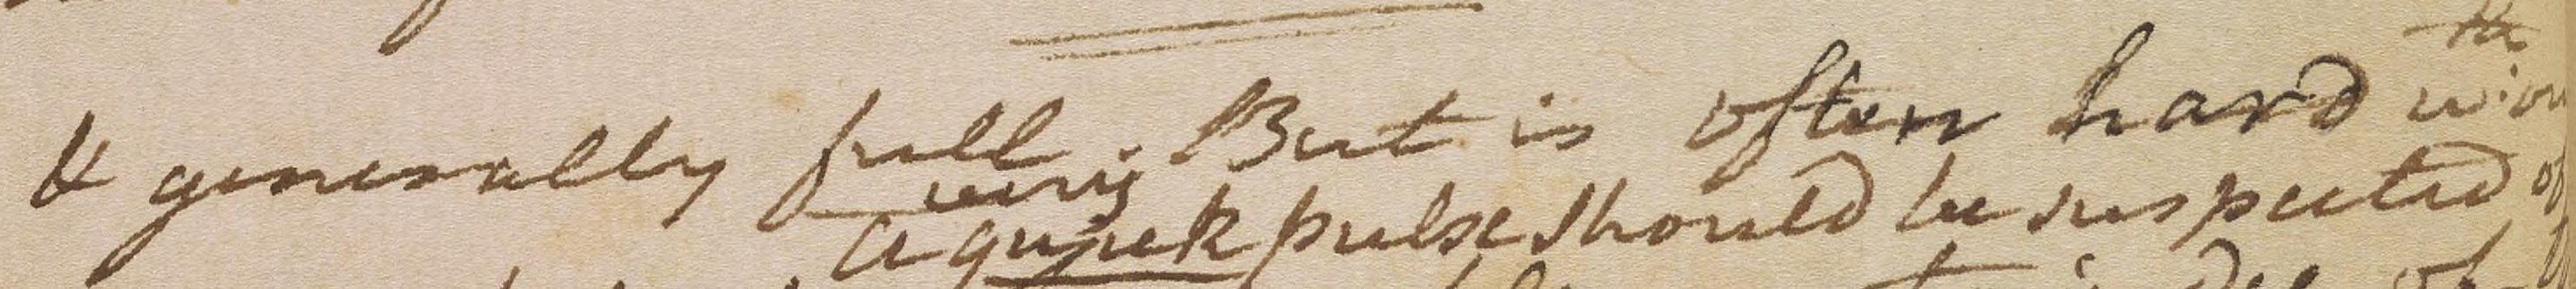& generally full. But is often hard w^th
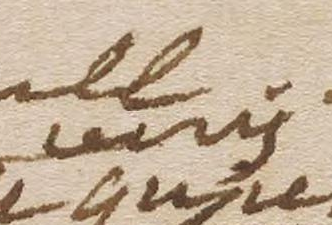very
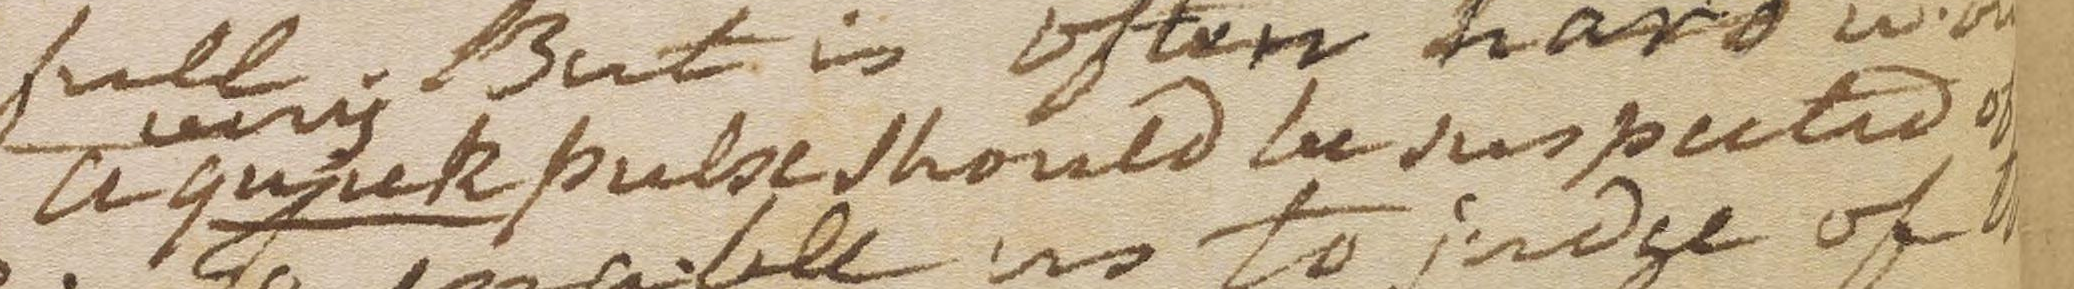a quick pulse should be suspected of
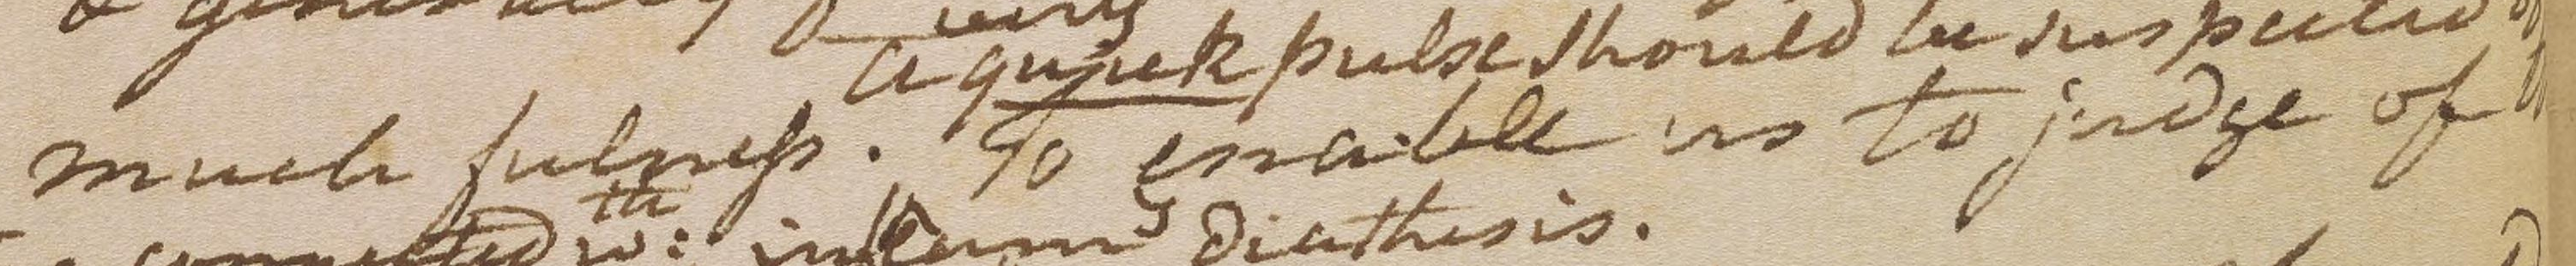much fulness. To enable us to judge of
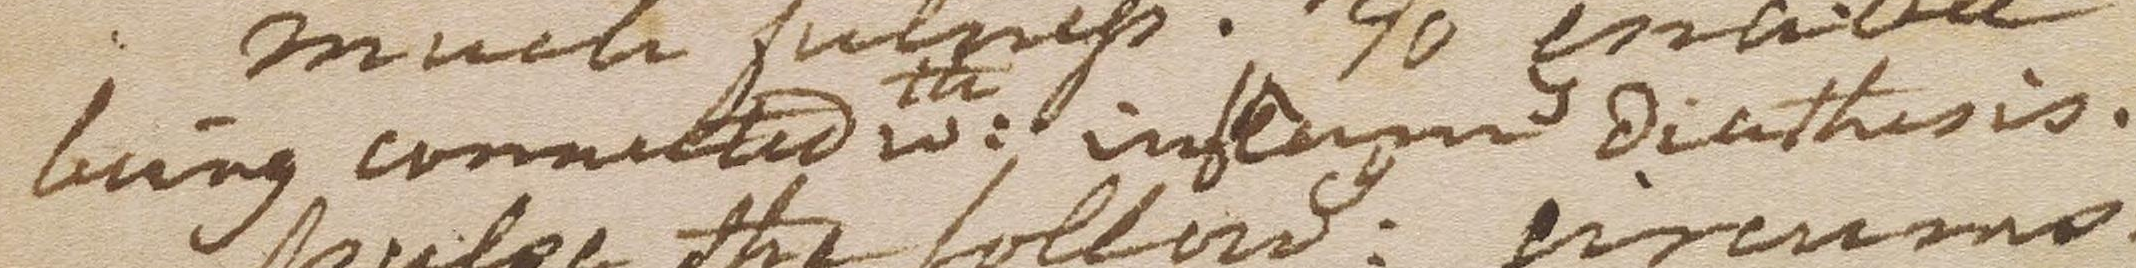being connected w^th inflam^y diathesis.
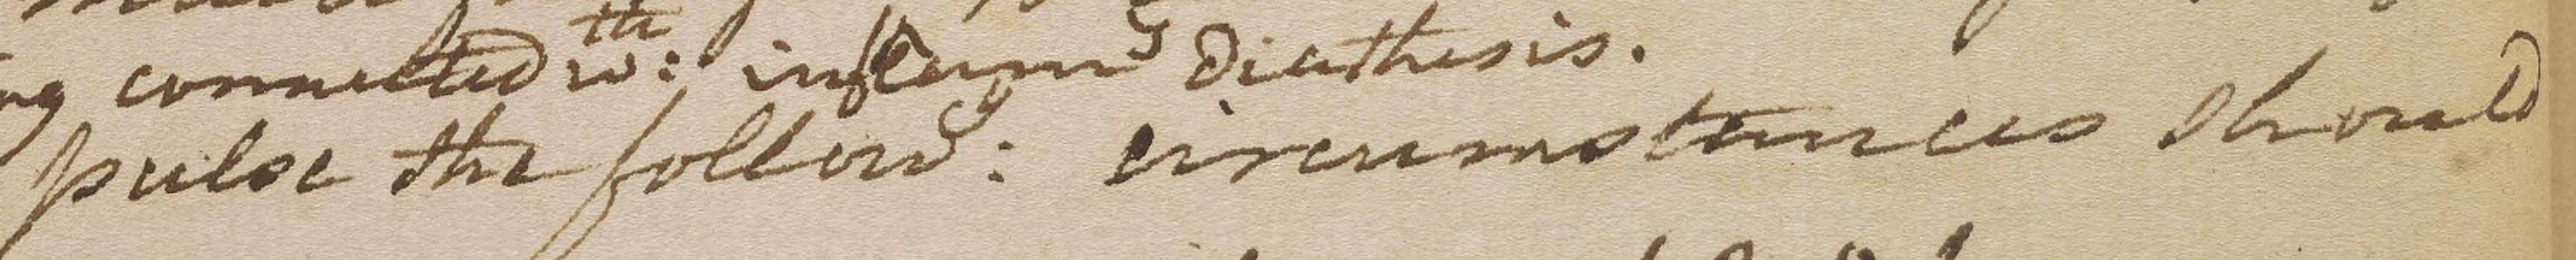pulse the follow: circumstances should
